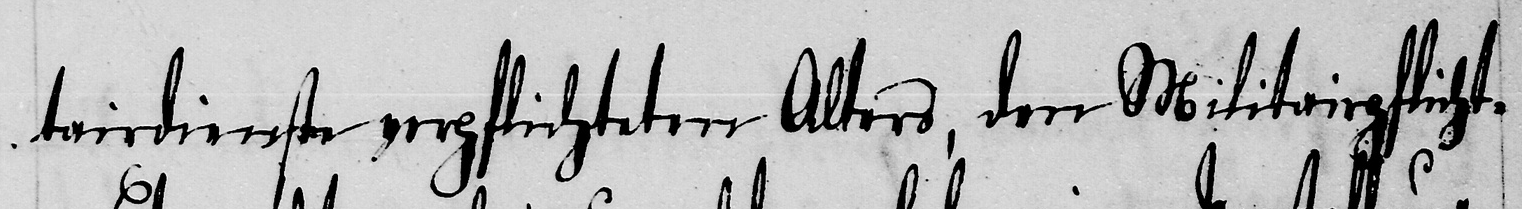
tairdienste verpflichteten Alters, den Militairpflicht¬
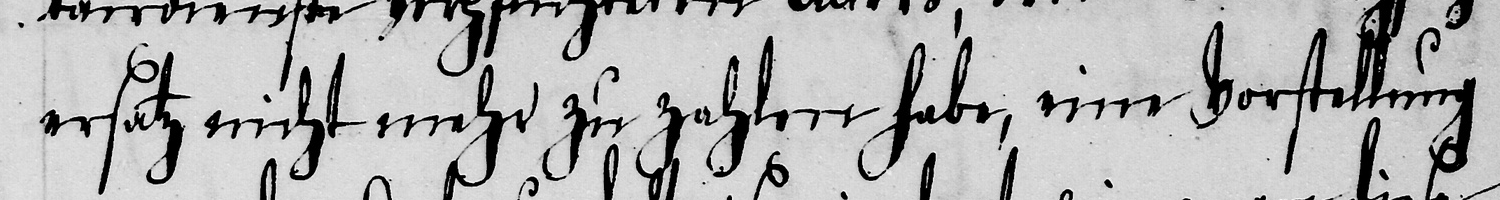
ersatz nicht mehr zu zahlen habe, eine Vorstellung
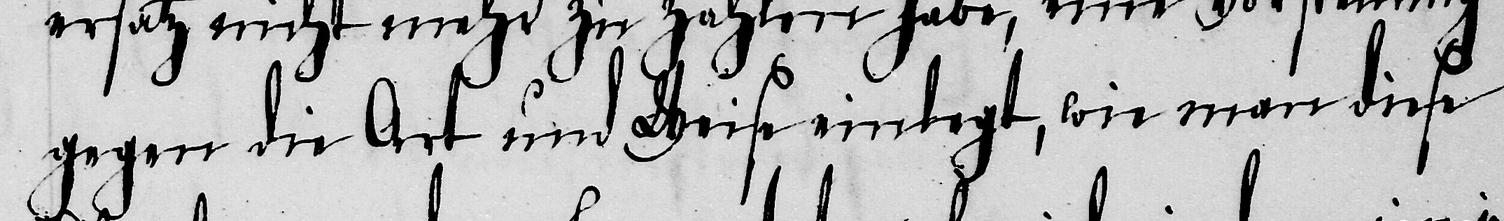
gegen die Art und Weise einlegt, wie man diese
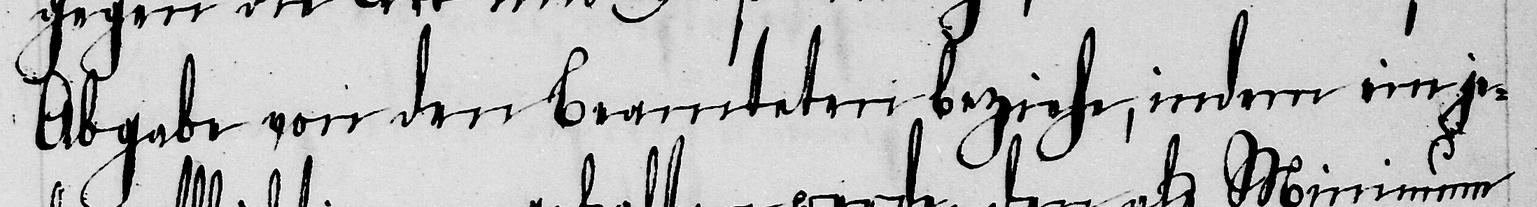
Abgabe von den Beamteten beziehe, indem ein je¬
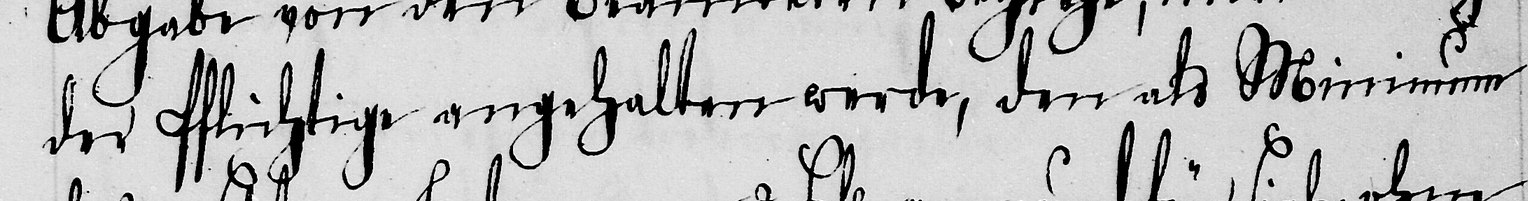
der Pflichtige angehalten werde, den als Minimum
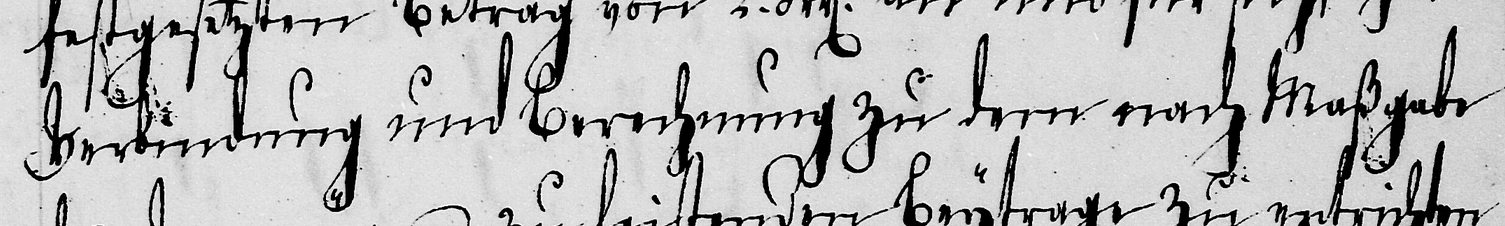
Verbindung und Berechnung zu dem nach Maßgabe
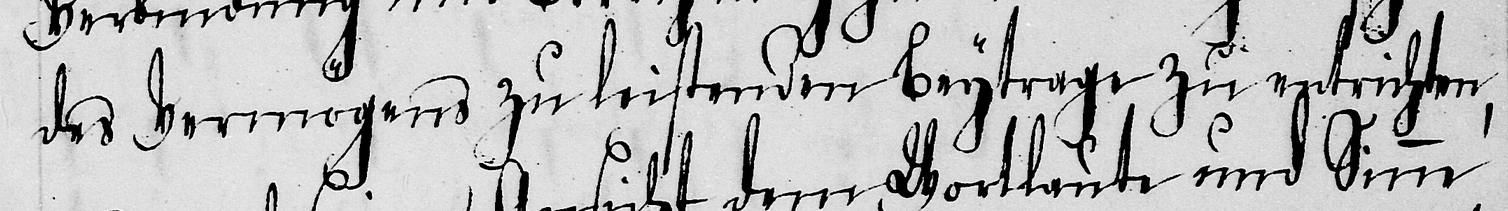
des Vermögens zu leistenden Beytrage zu entrichten,
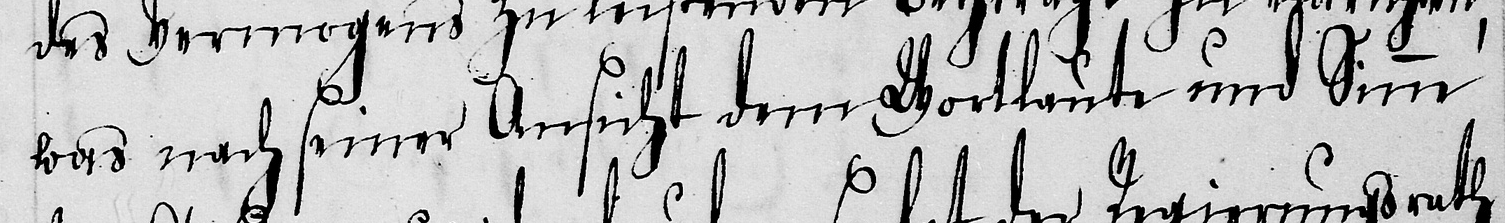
was nach seiner Ansicht dem Wortlaute und Sinne
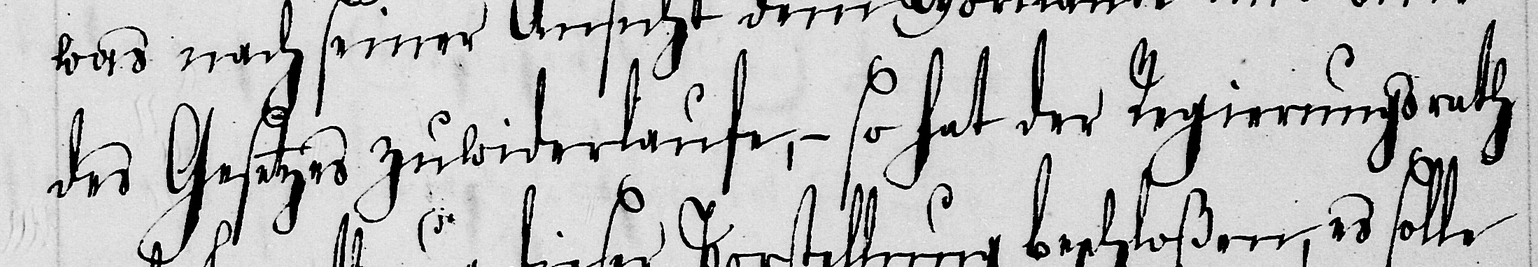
des Gesetzes zuwiderlaufe, – so hat der Regierungsrath
